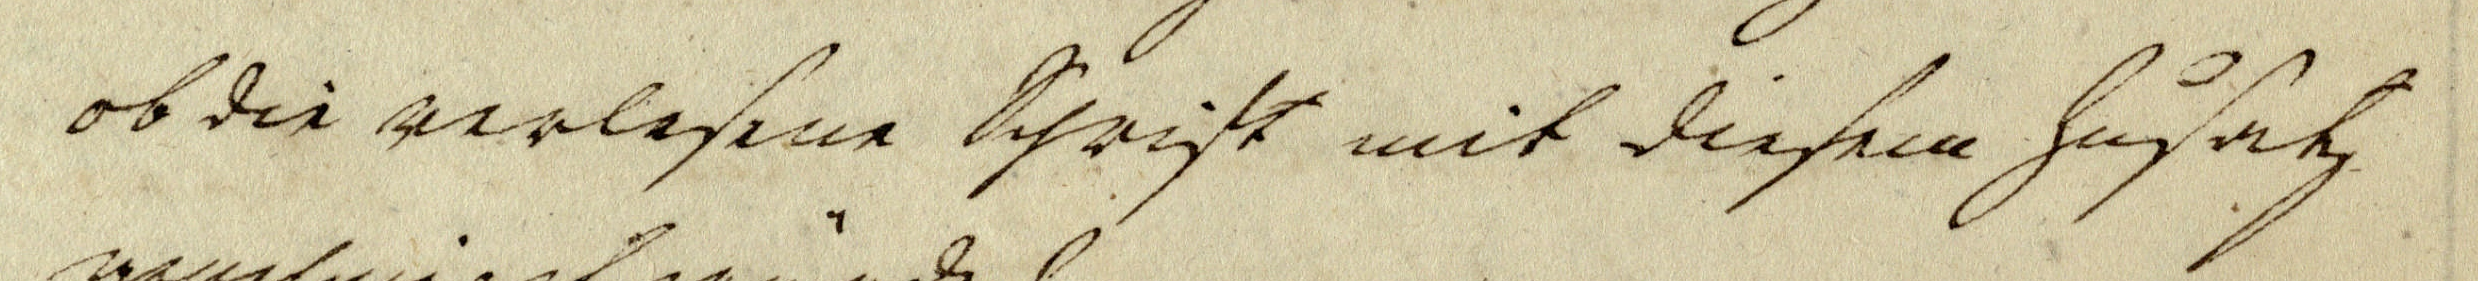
ob die verlesene Schrift mit diesem Zusatz
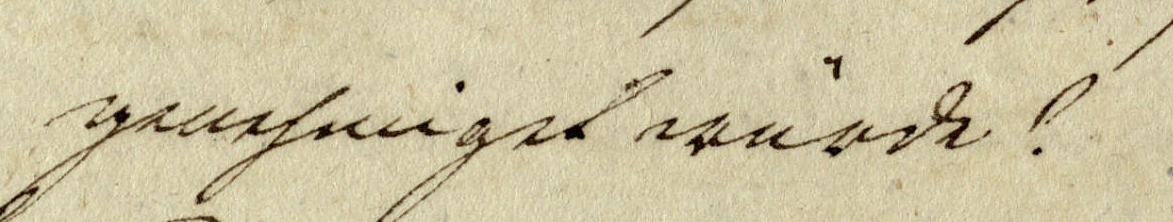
genehmiget würde?
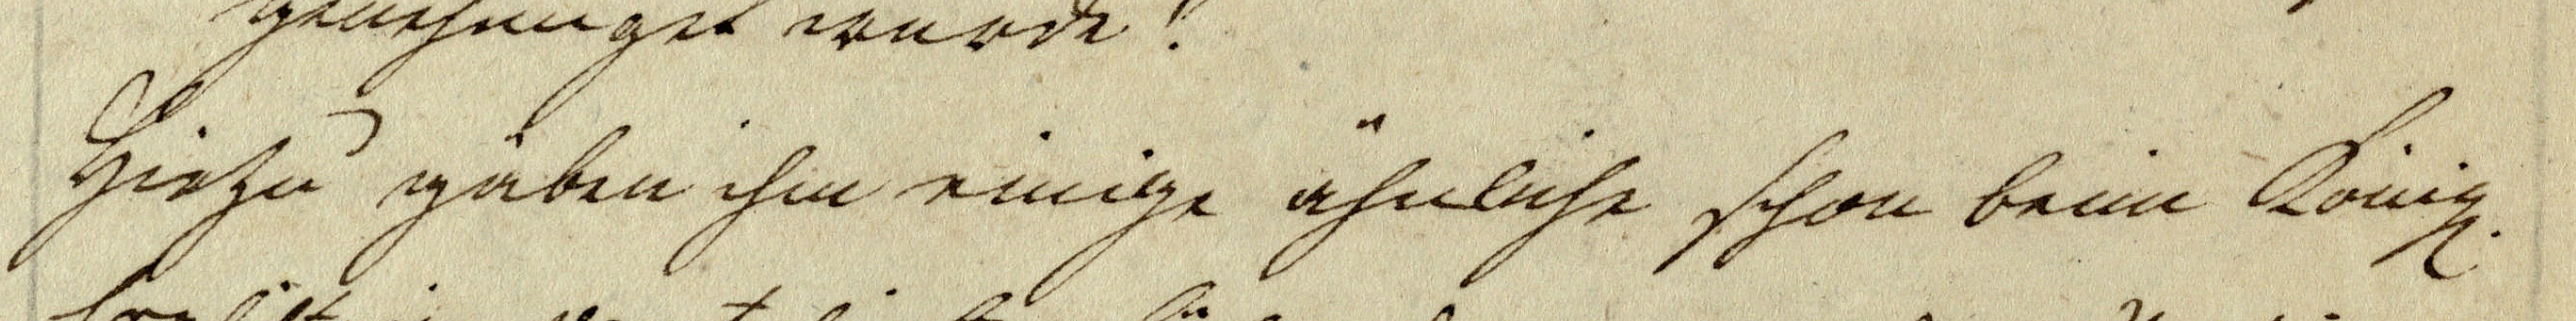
Hiezu gäben ihm einige ähnliche schon beim Königl.
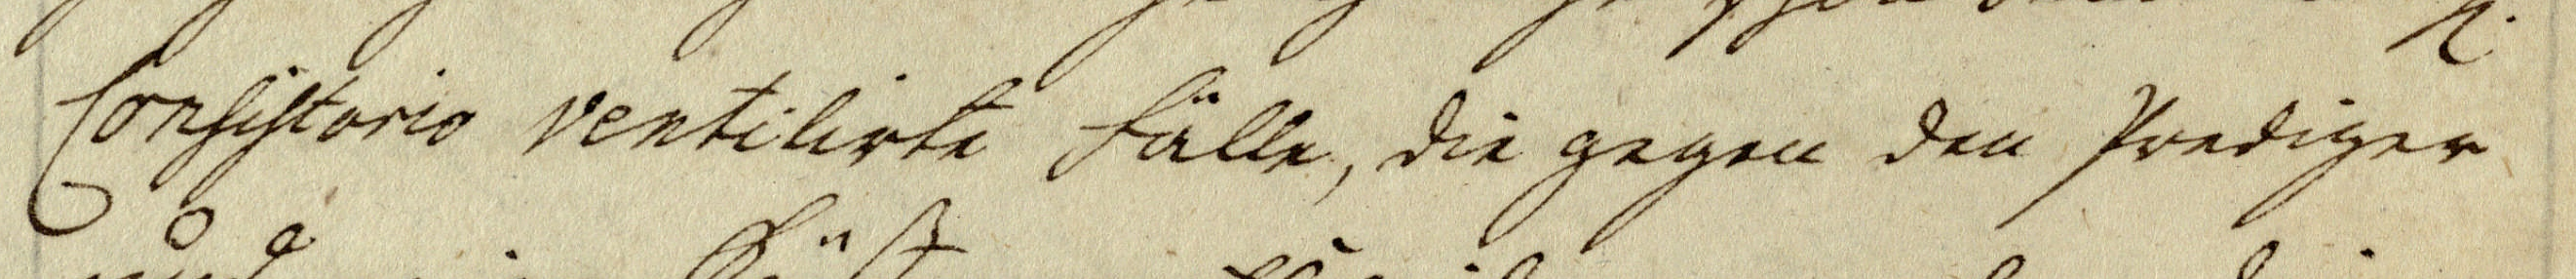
Consistorio ventilirte Fälle, die gegen den Prediger
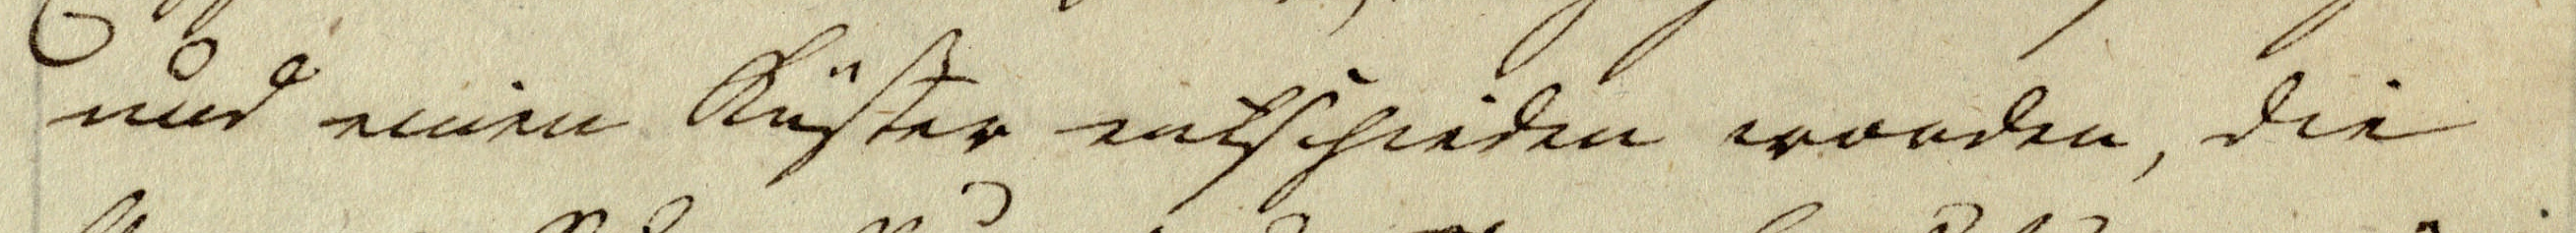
und einen Küster entschieden worden, die
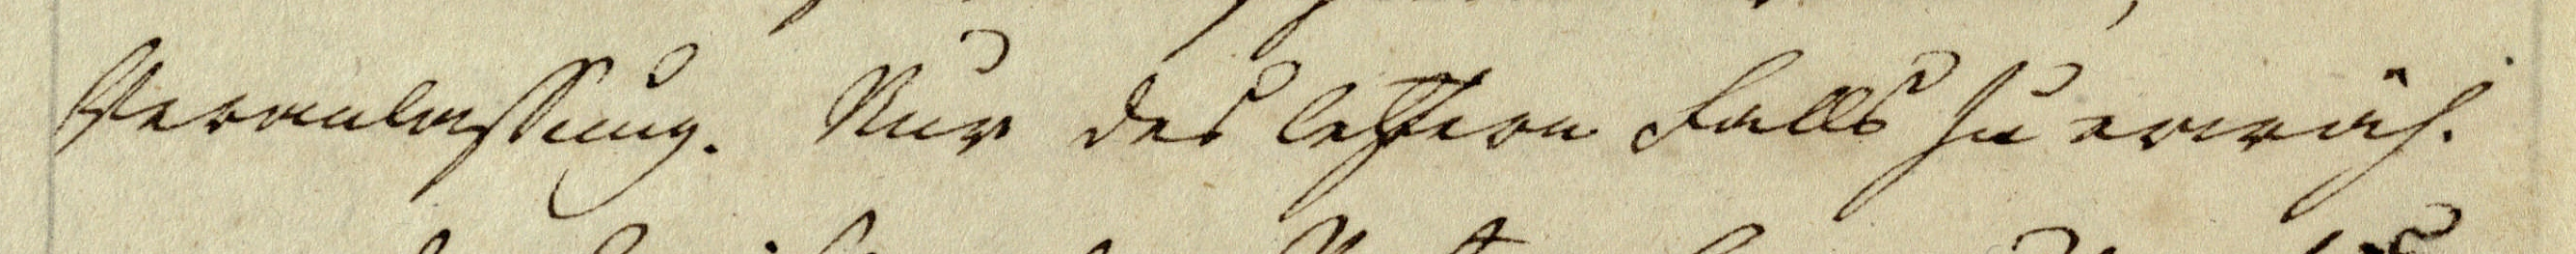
Veranlassung. Nur des letztern Falls zu erwäh¬
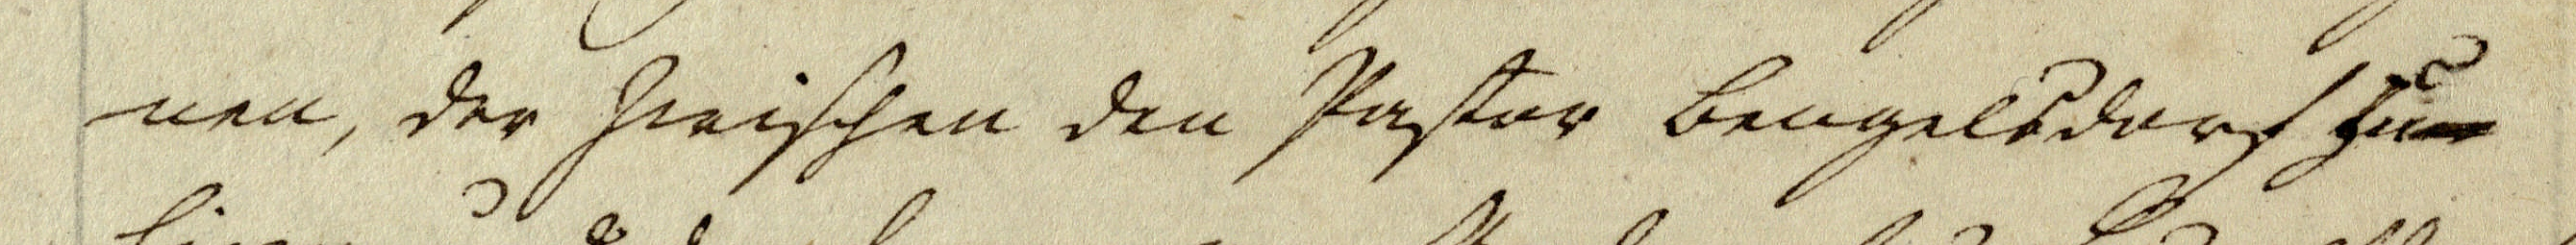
nen, der zwischen den Pastor Bengelsdorf zu
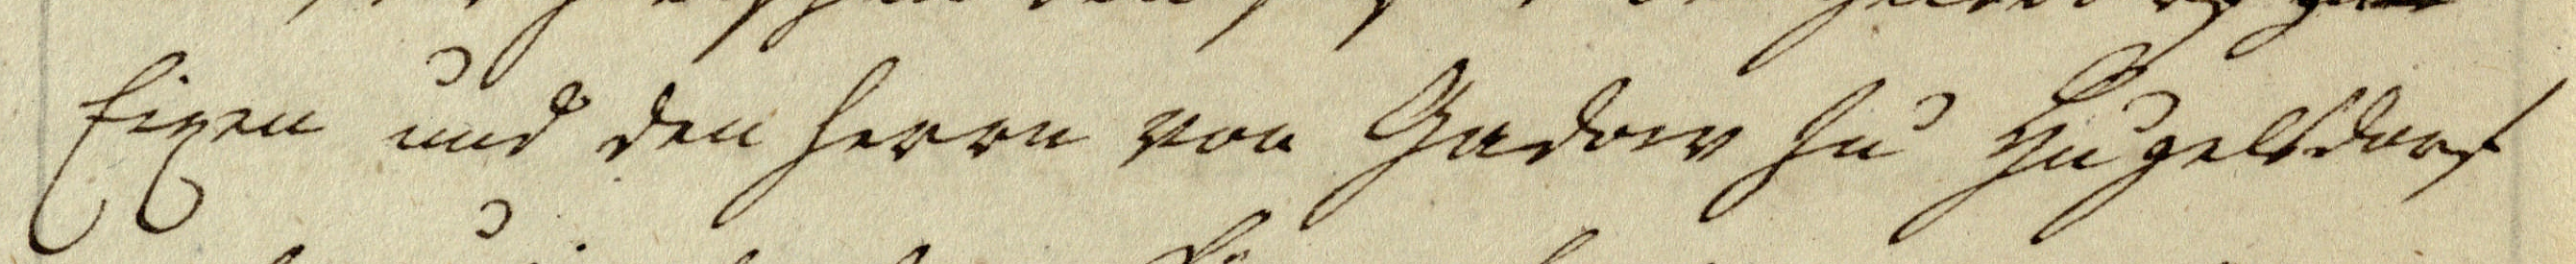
Eixen und den Herrn von Gadow zu Hugelsdorf
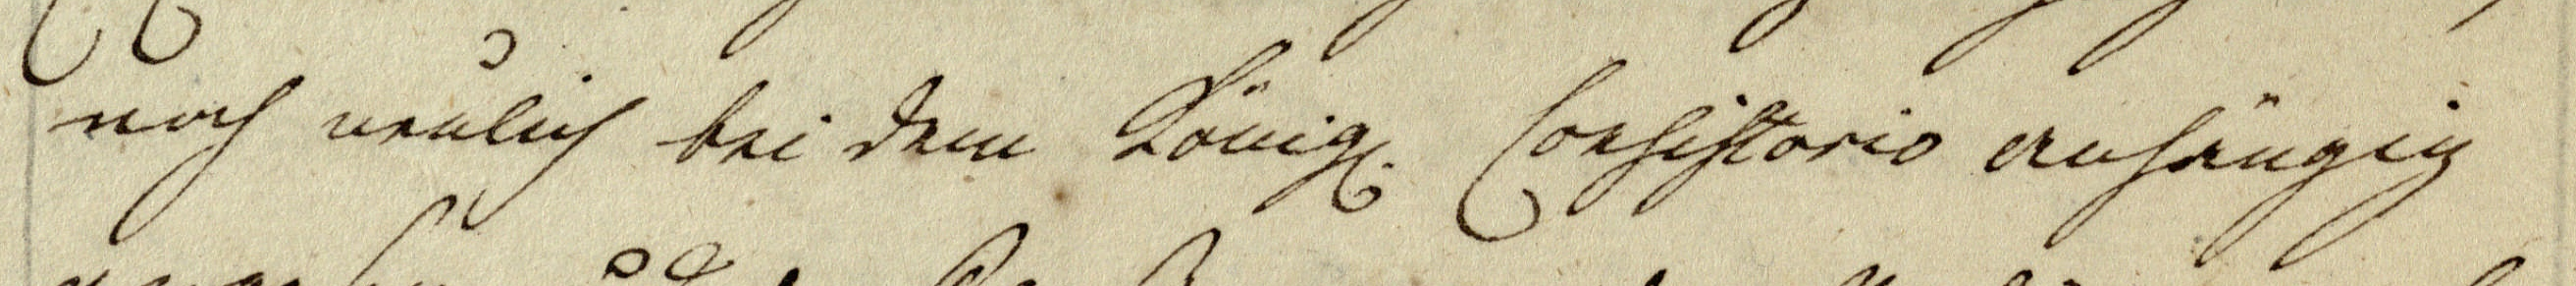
noch neulich bei dem Königl. Consistorio anhängig
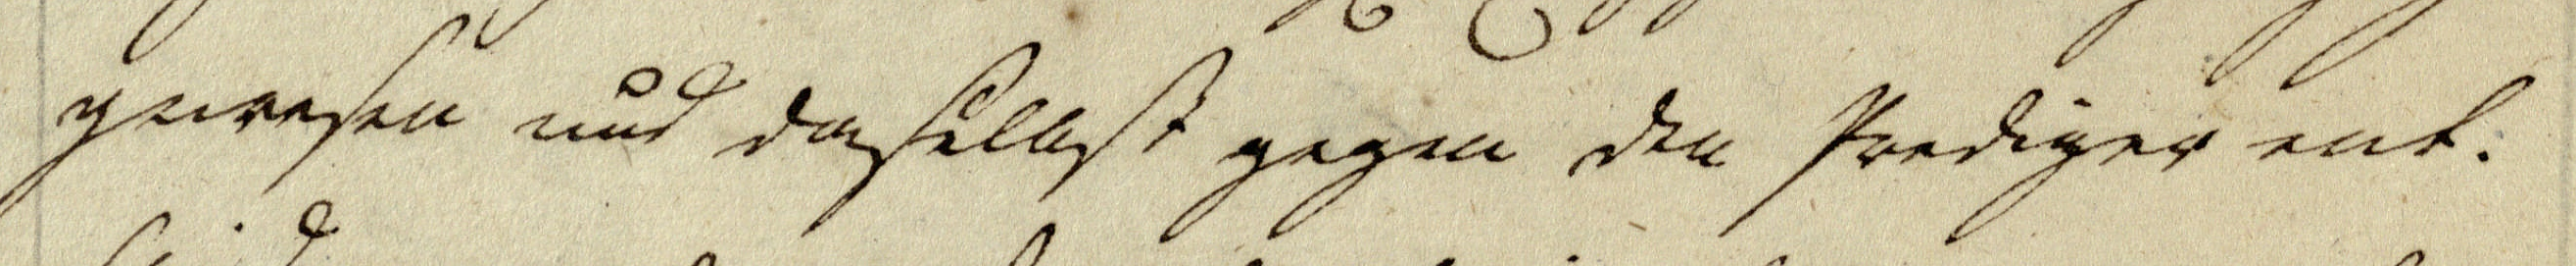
gewesen und daselbst gegen den Prediger ent¬
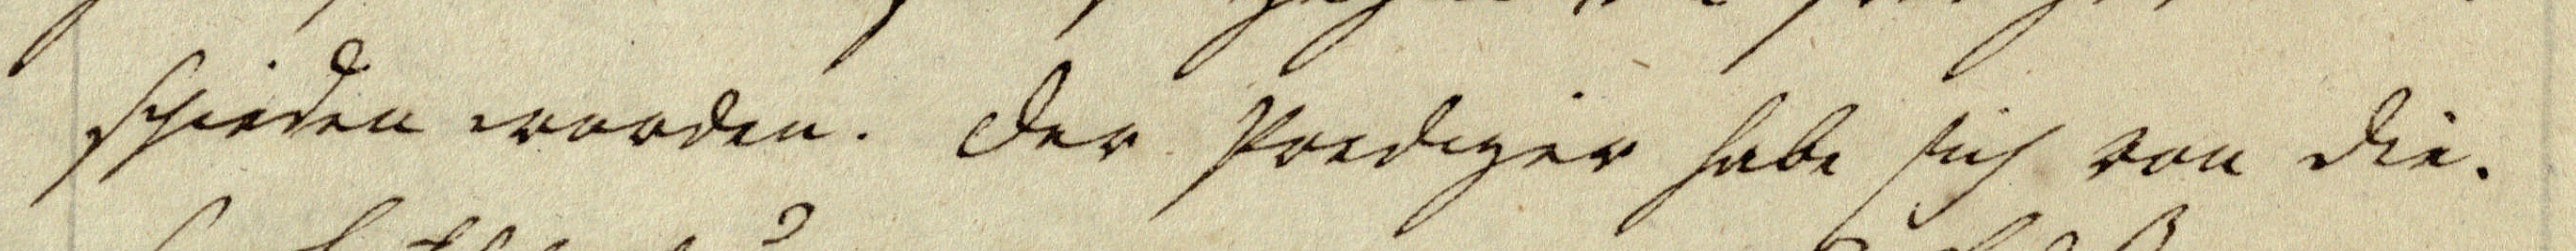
schieden worden. Der Prediger habe sich von die¬
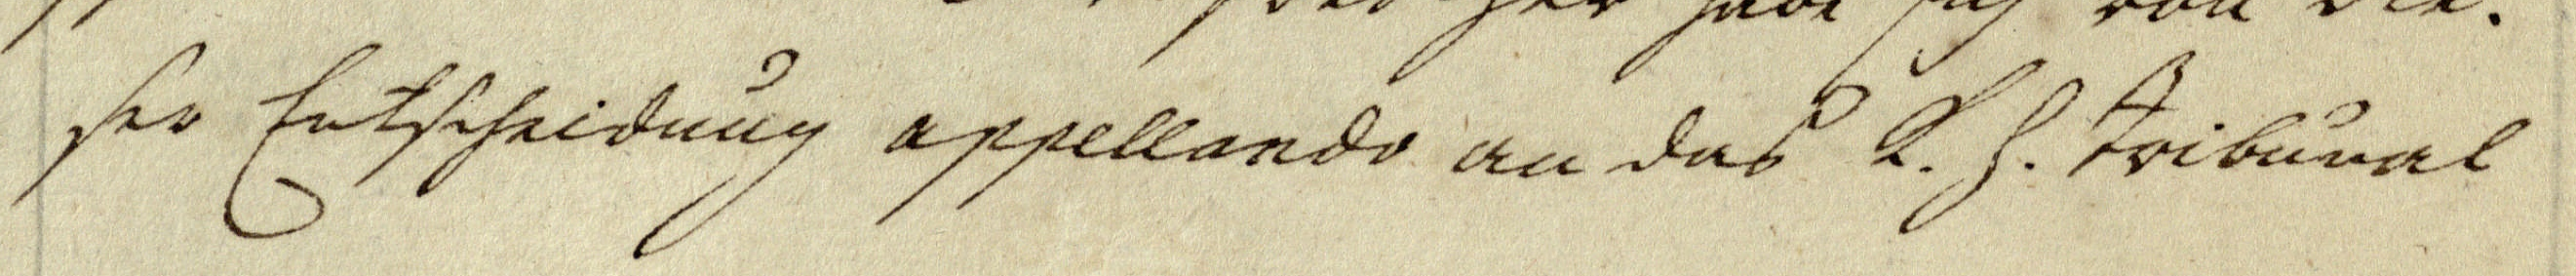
ser Entscheidung appellando an das K. h. Tribunal
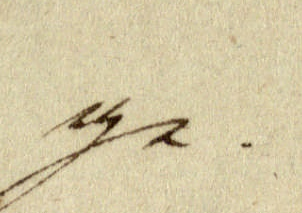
ge
